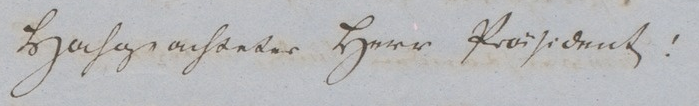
Hochgeachteter Herr Präsident!
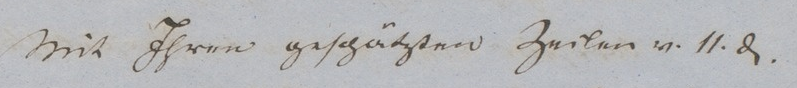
Mit Ihren geschätzten Zeilen v. 11. d.
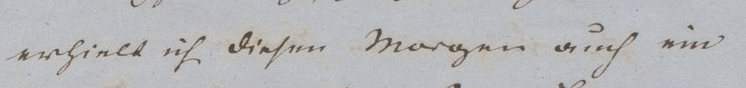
erhielt ich diesen Morgen auch ein
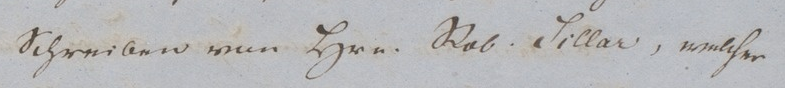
Schreiben von Hrn. Rob. Sillar, welcher
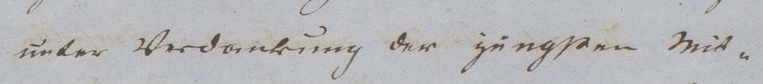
unter Verdankung der jüngsten Mit-
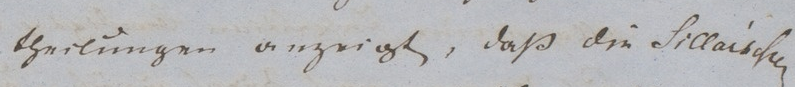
theilungen anzeigt, daß die Sillar'schen
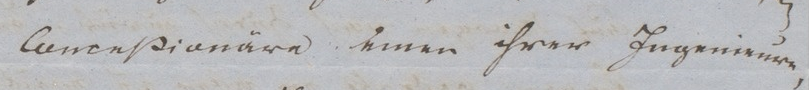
Conceßionäre einen ihrer Ingenieure,
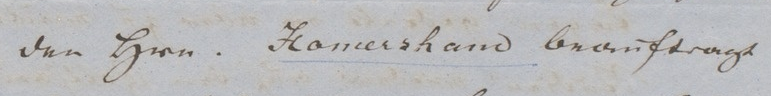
den Hrn. Hamersham beauftragt
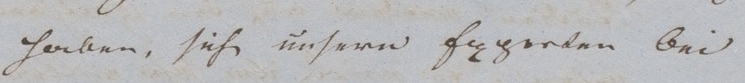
haben, sich unsern Experten bei
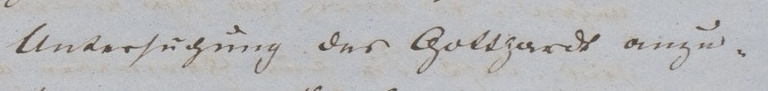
Untersuchung des Gotthardt anzu-
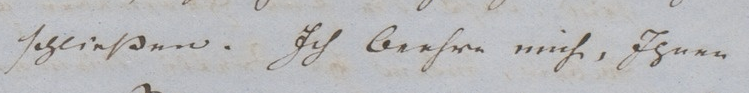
schließen. Ich beehre mich, Ihnen
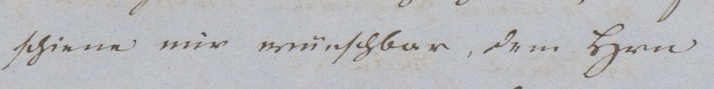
schiene mir wünschbar, dem Hrn
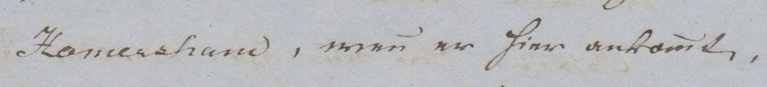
Hamersham, wenn er hier ankommt,
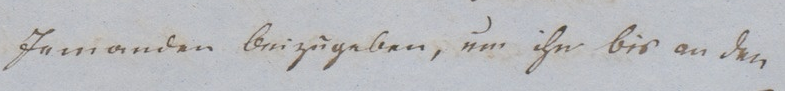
Jemanden beizugeben, um ihn bis an den
